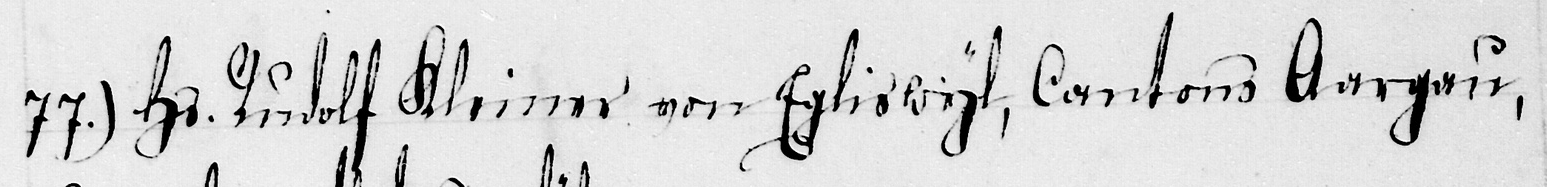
77.) Hs. Rudolf Kleiner von Egliswyl, Cantons Aargau,
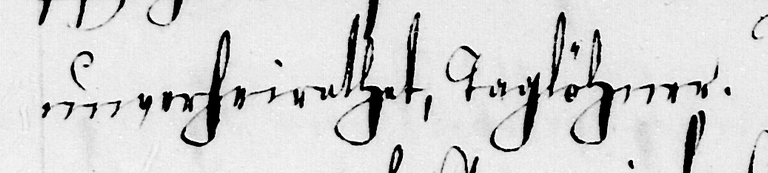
unverheirathet, Taglöhner.
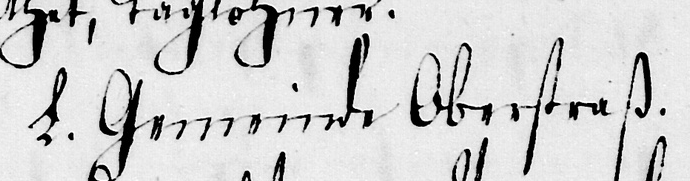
L. Gemeinde Oberstraß.
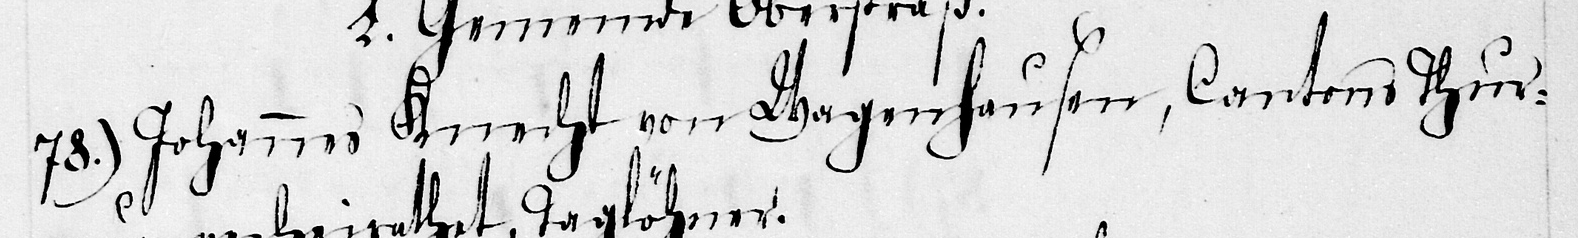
78.) Johannes Knecht von Wagenhausen, Cantons Thur¬
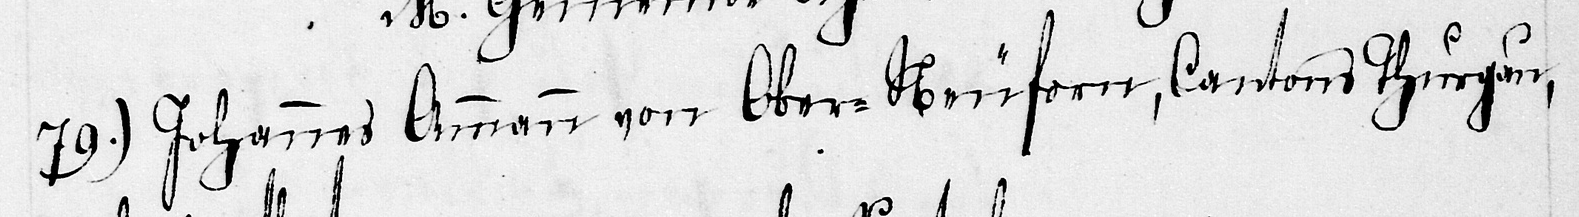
79.) Johannes Ammann von Ober-Neuforn, Cantons Thurgau,
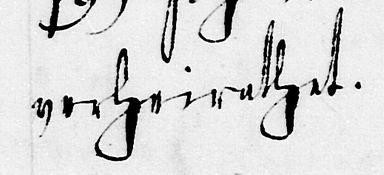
verheirathet.
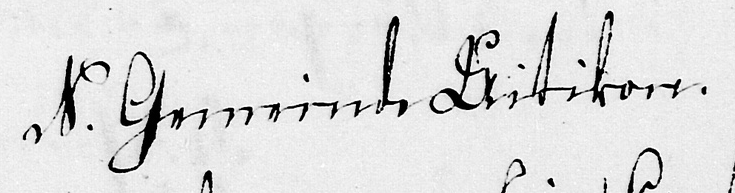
N. Gemeinde Uitikon.
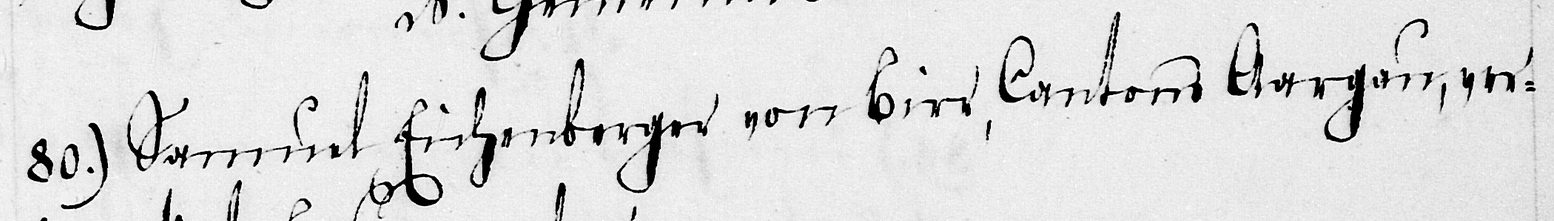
80.) Samuel Eichenberger von Birr, Cantons Aargau, ver¬
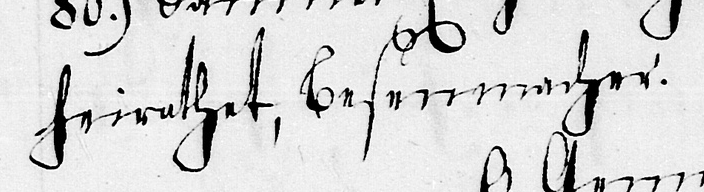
heirathet, Besenmacher.
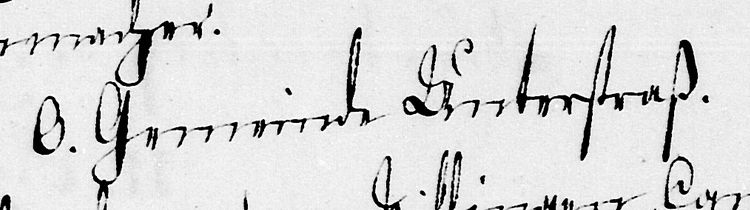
O. Gemeinde Unterstraß.
